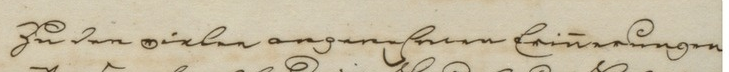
Zu den vielen angenehmen Erinnerungen
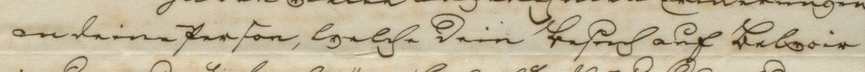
an Deine Person, welche Dein Besuch auf Belvoir
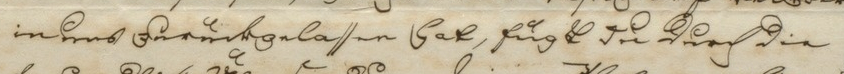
in uns zurückgelassen hat, fügst Du durch die
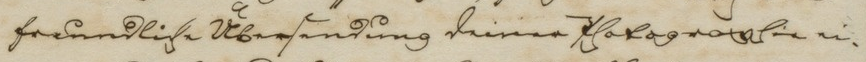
freundliche Übersendung Deiner Photographie ei-
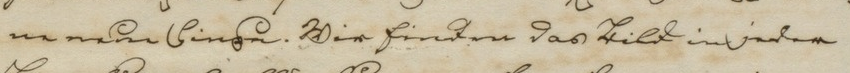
ne neue hinzu. Wir finden das Bild in jeder
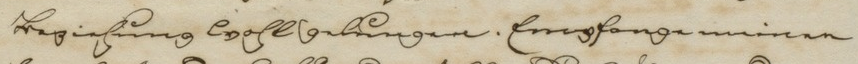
Beziehung wohl gelungen. Empfange meinen
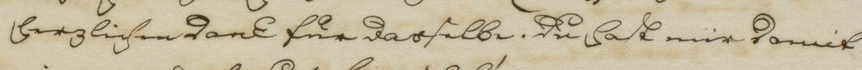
herzlichen Dank für dasselbe. Du hast mir damit
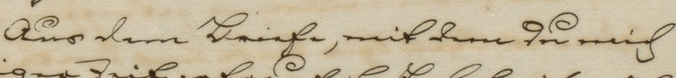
Aus dem Briefe, mit dem Du mich
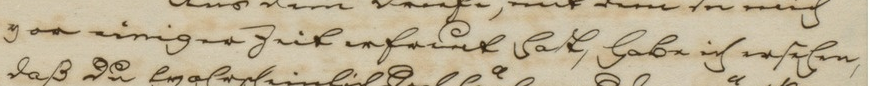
vor einiger Zeit erfreut hast, habe ich ersehen,
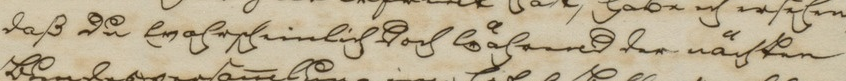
daß Du wahrscheinlich doch während der nächsten
